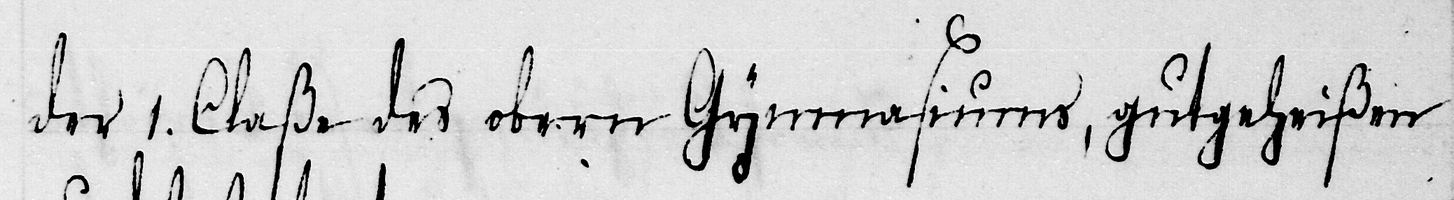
der 1. Claße des obern Gymnasiums, gutgeheißen
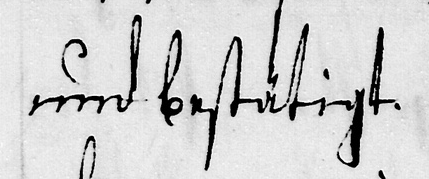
und bestätigt.
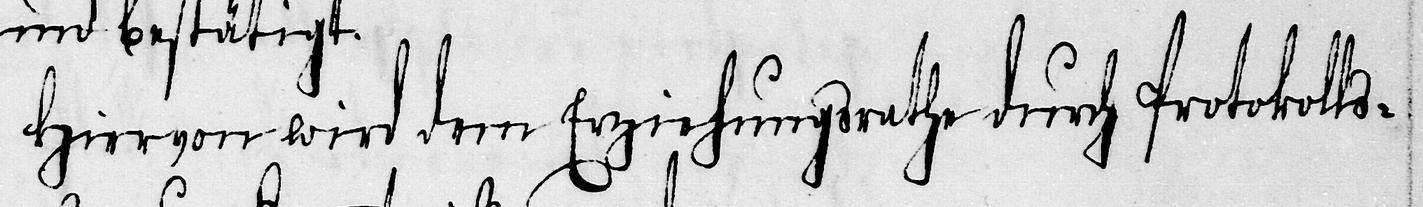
Hiervon wird dem Erziehungsrathe durch Protokolls¬
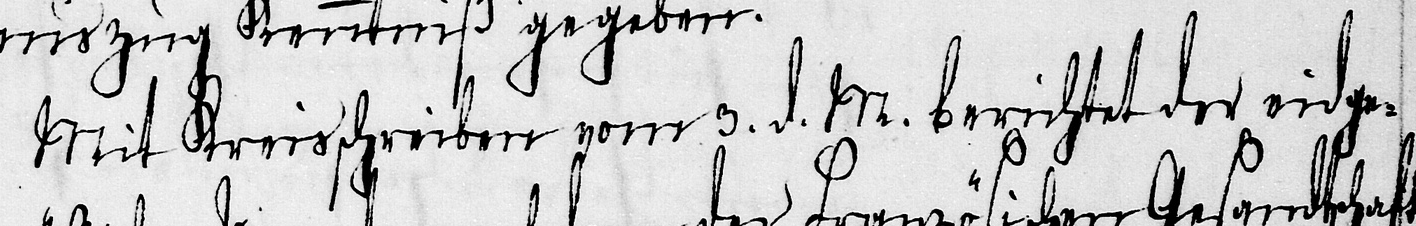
Mit Kreisschreiben vom 3. d. M. berichtet der eidge¬
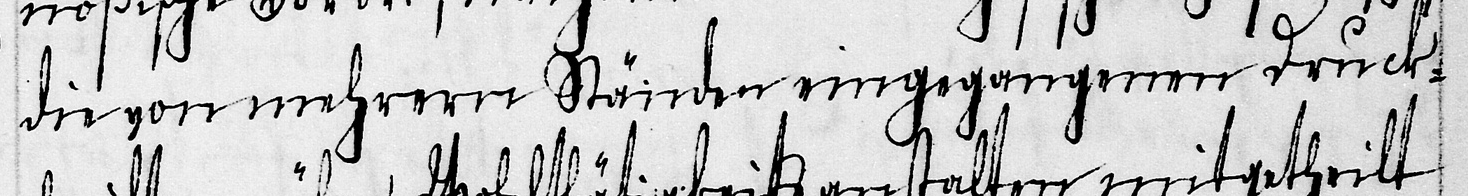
die von mehrern Ständen eingegangenen Druck¬
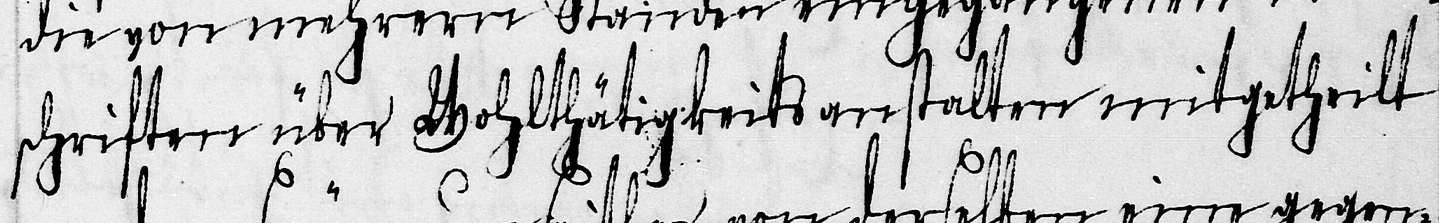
schriften über Wohlthätigkeitsanstalten mitgetheilt
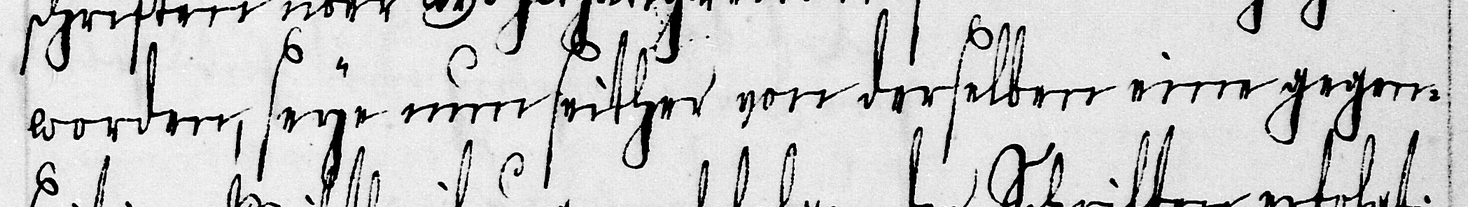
worden, seye nun seither von derselben eine gegen¬
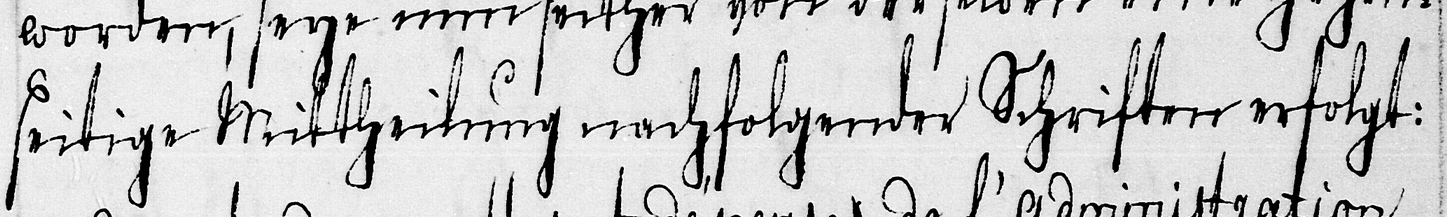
seitige Mittheilung nachfolgender Schriften erfolgt:
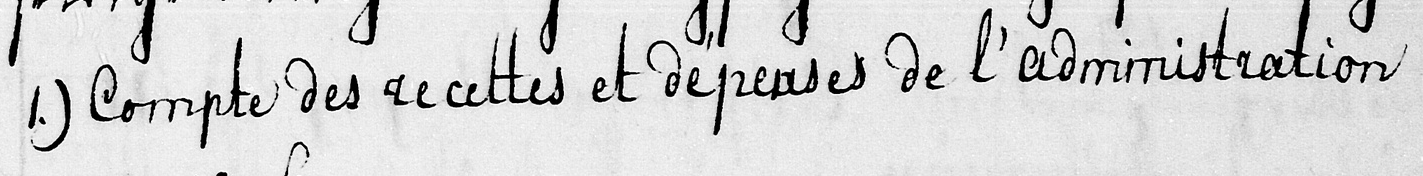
1.) Compte des recettes et depenses de l’administration
